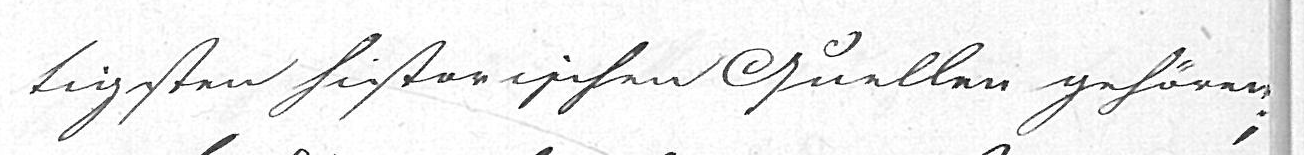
tigsten historischen Quellen gehören;
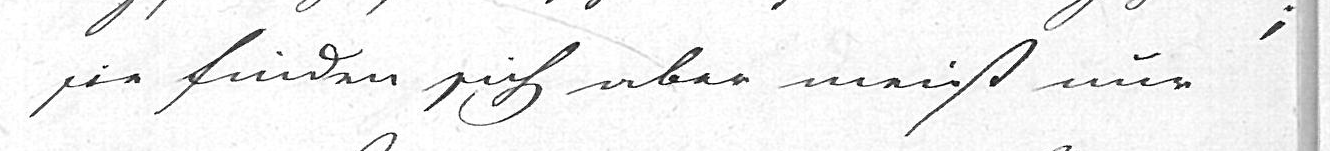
sie finden sich aber meist nur
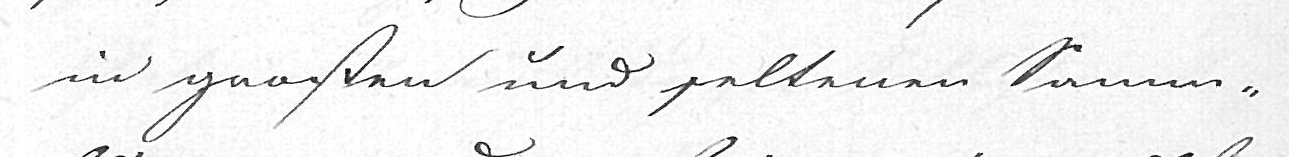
in großen und seltenen Samm-
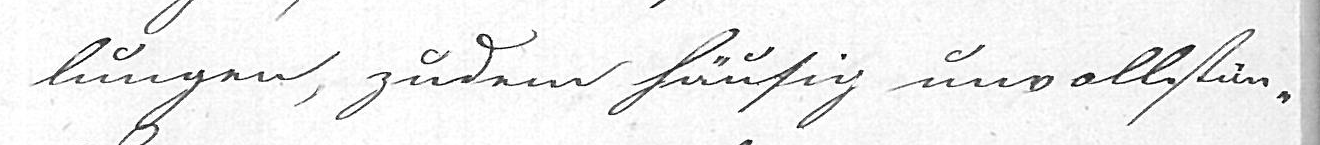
lungen, zudem häufig unvollstän-
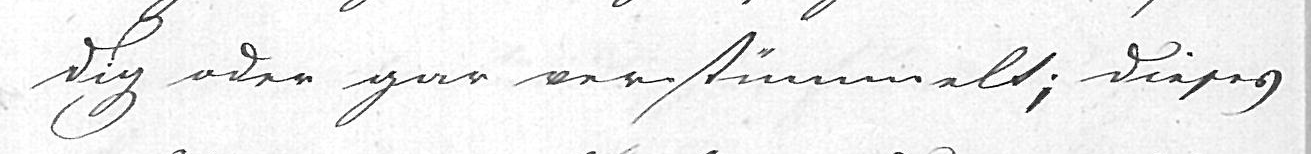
dig oder gar verstümmelt; dieses
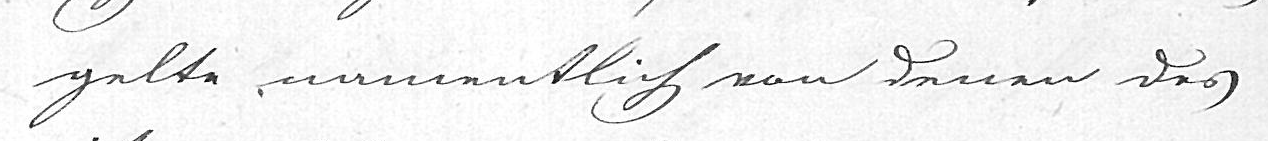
gelte namentlich von denen des
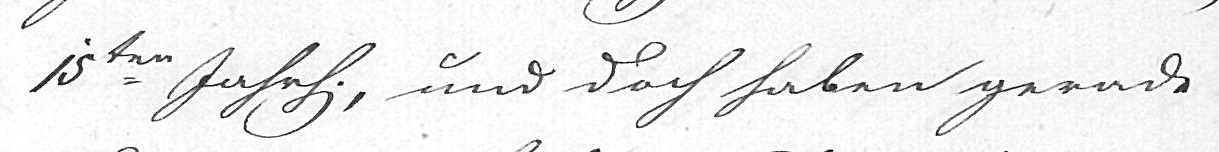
15ten Jahrh., und doch haben gerade
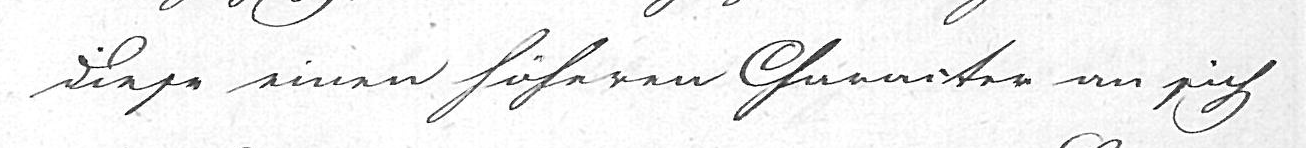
diese einen höheren Character an sich
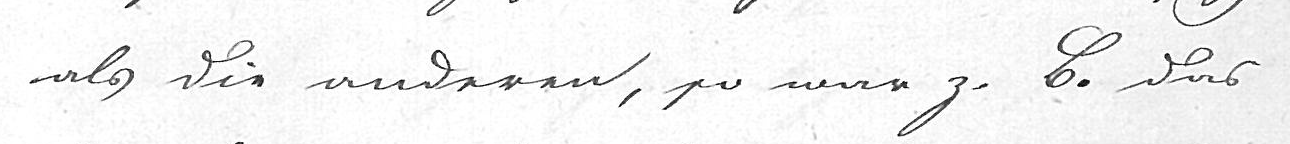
als die anderen, so war z. B. das
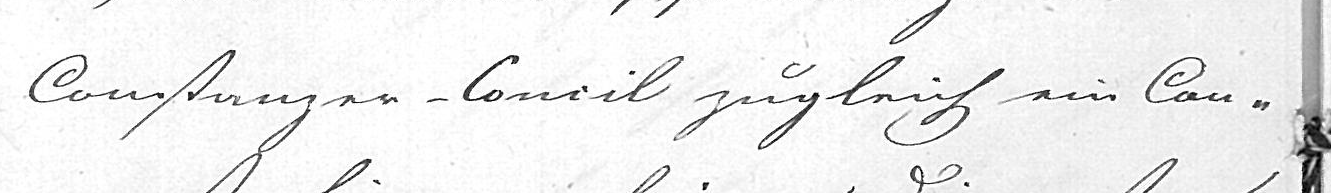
Constanzer Concil zugleich ein Con-
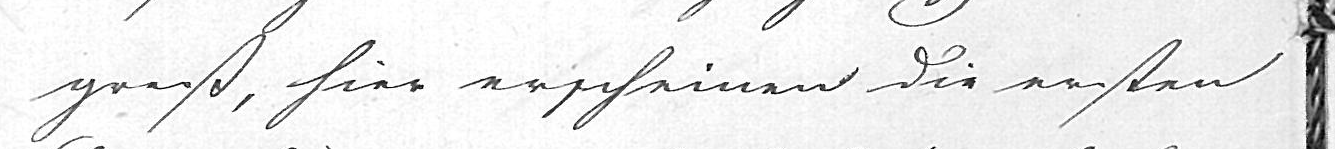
greß, hier erscheinen die ersten
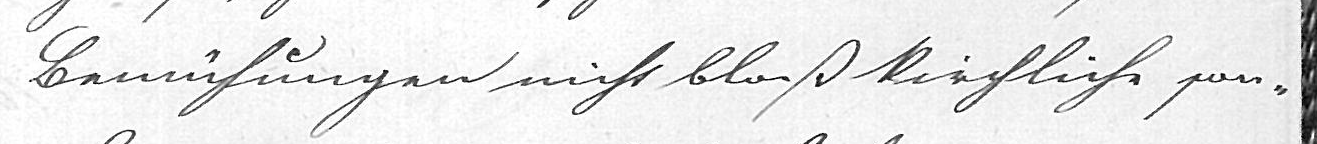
Bemichungen nicht bloß kirchliche, son-
